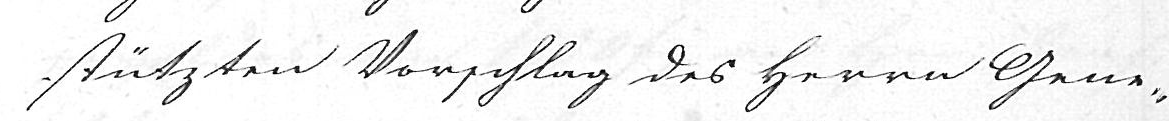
stützten Vorschlag des Herrn Gene-
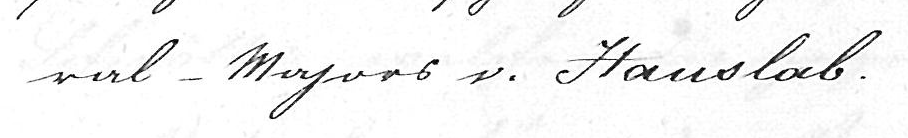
ral-Majors v. Hauslab.
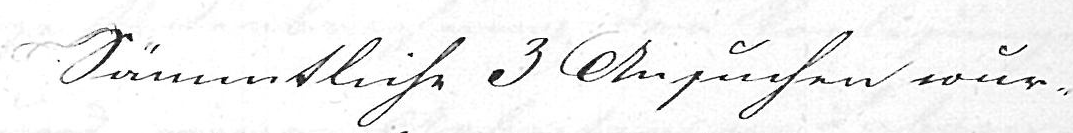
Sämmtliche 3 Ansuchen wur-
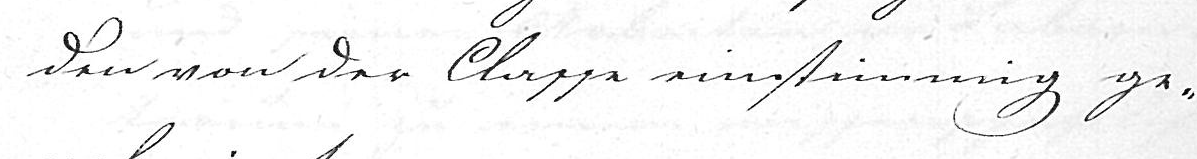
den von der Classe einstimmig ge-
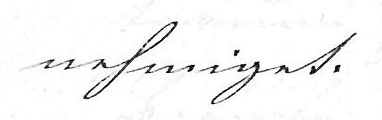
nehmiget.
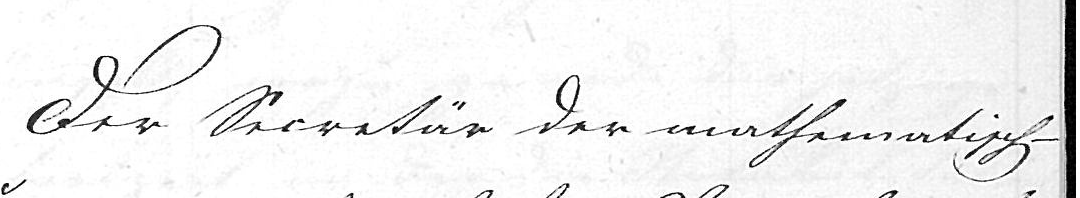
Der Secretär der mathematisch-
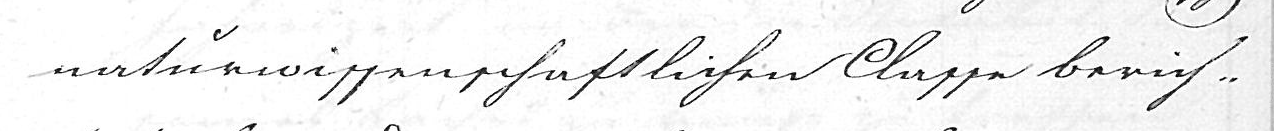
naturwissenschaftlichen Classe berich-
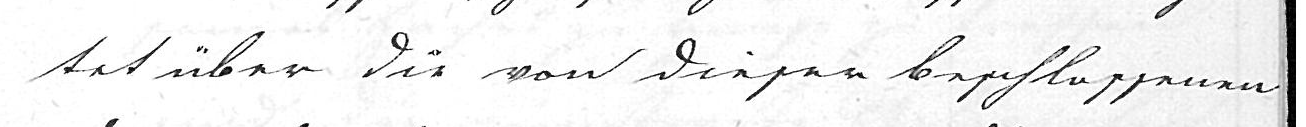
tet über die von dieser beschlossenen
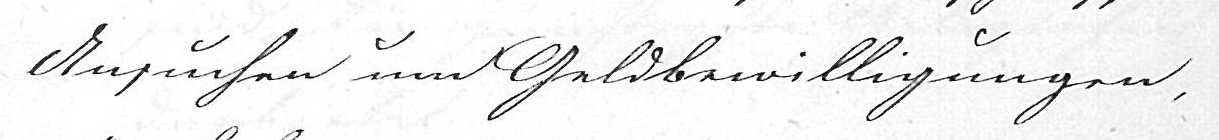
Ansuchen um Geldbewilligungen,
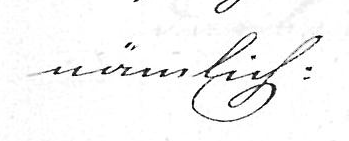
nämlich:
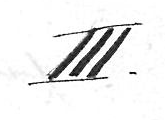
III.
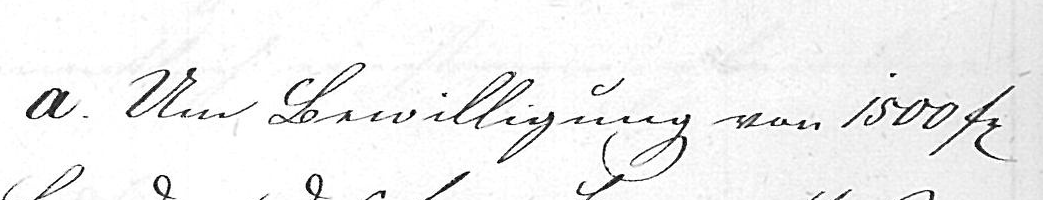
a. Um Bewilligung von 1500 fr
